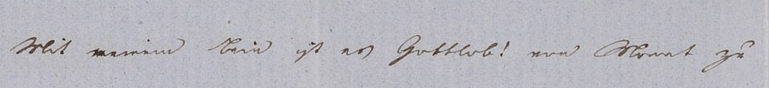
Mit meinem Bein ist es Gottlob! von Monat zu
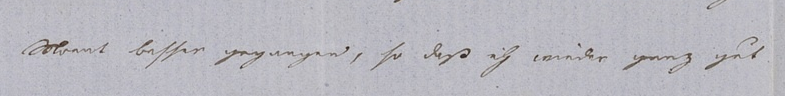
Monat besser gegangen, so daß ich wieder ganz gut
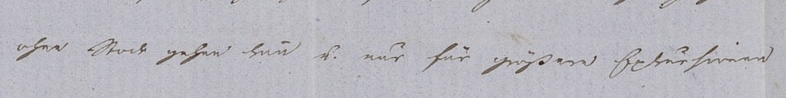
ohne Stock gehen kann u. nur für größere Exkursionen
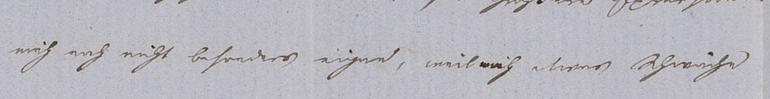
mich noch nicht besonders eigne, weil noch etwas Schwäche
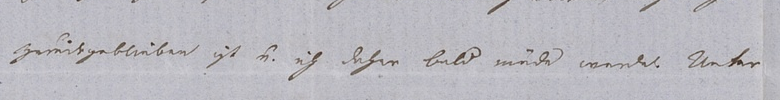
zurückgeblieben ist u. ich daher bald müde werde. Unter
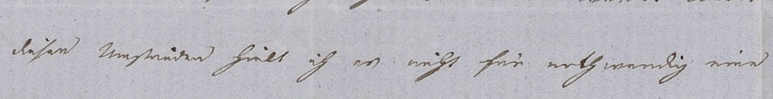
diesen Umständen hielt ich es nicht für nothwendig eine
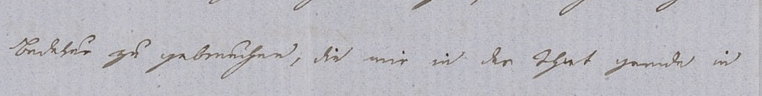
Badekur zu gebrauchen, die mir in der That gerade in
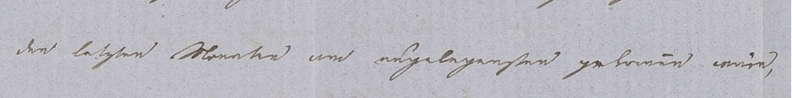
den letzten Monaten am ungelegensten gekommen wäre,
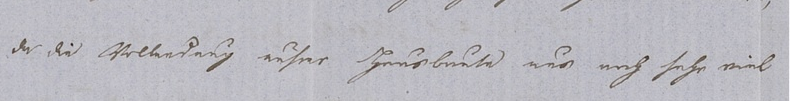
da die Vollendung unsrer Hausbaute uns noch sehr viel
